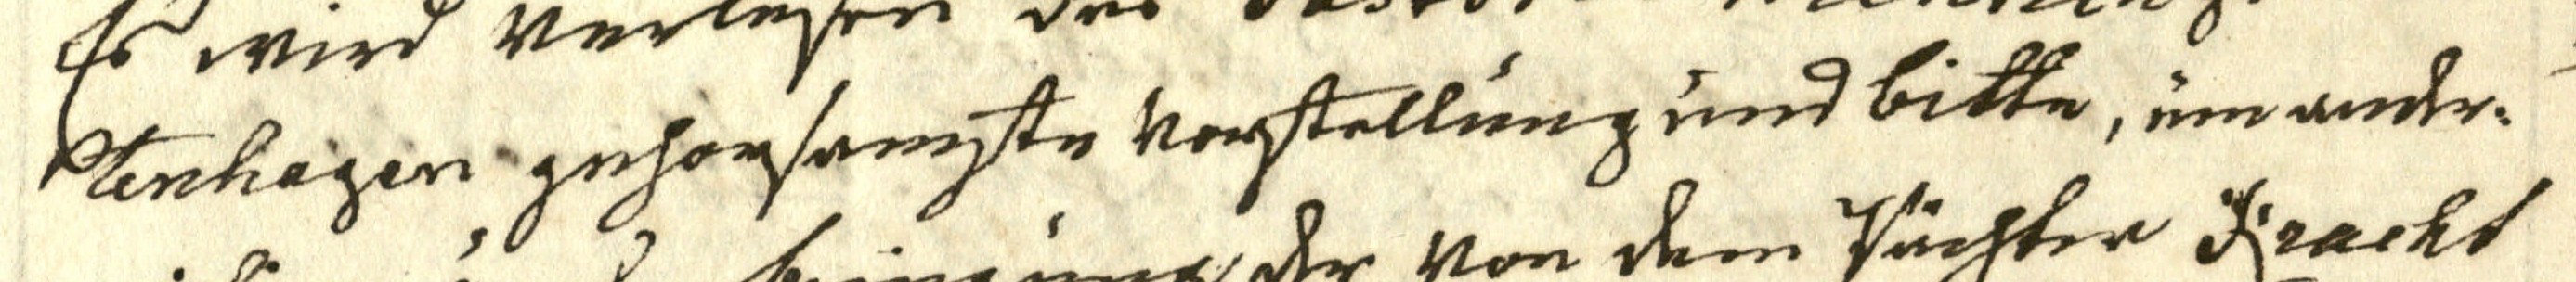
tenhagen gehorsamste Vorstellung und Bitte, um ander¬
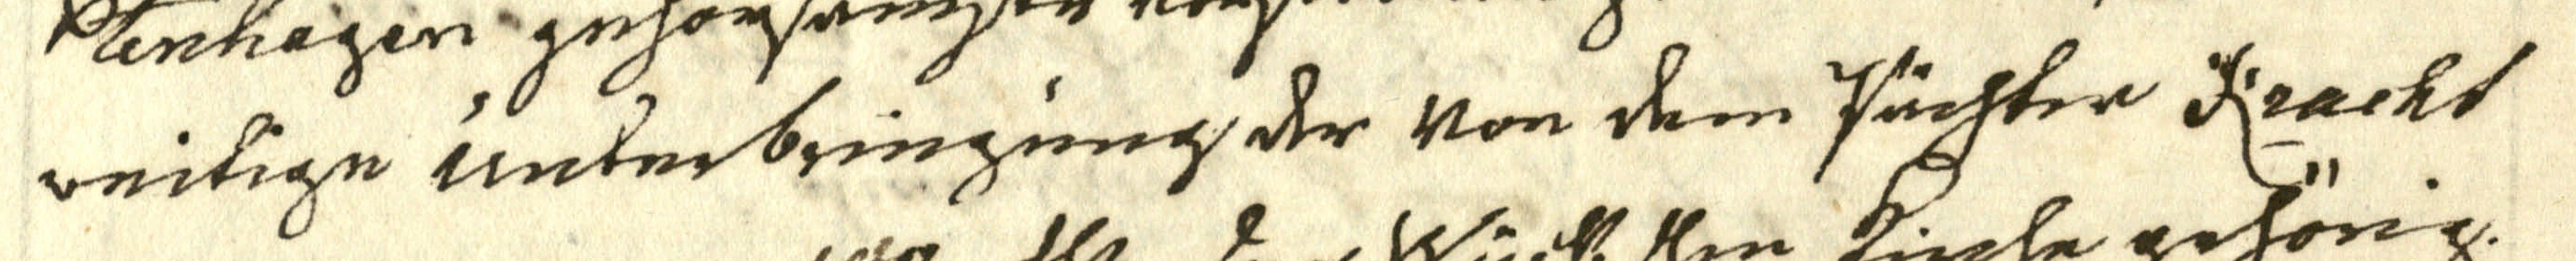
weitige Unterbringung der von dem Pächter Kracht
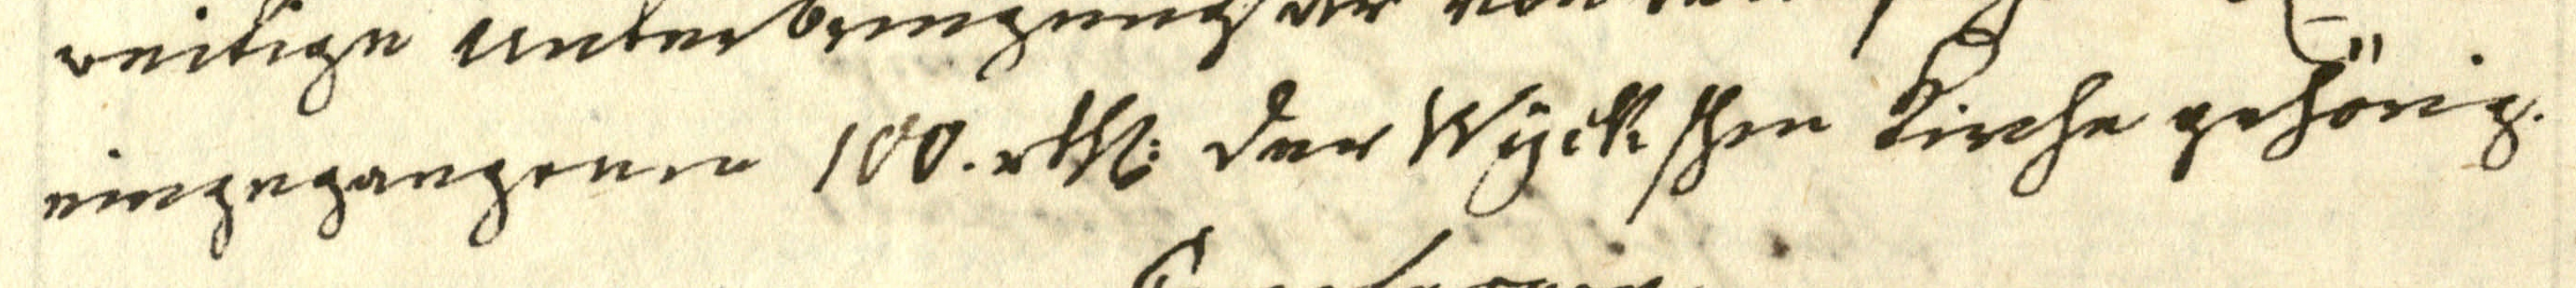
eingegangenen 100. rtl. der Wÿckschen Kirche gehörig.
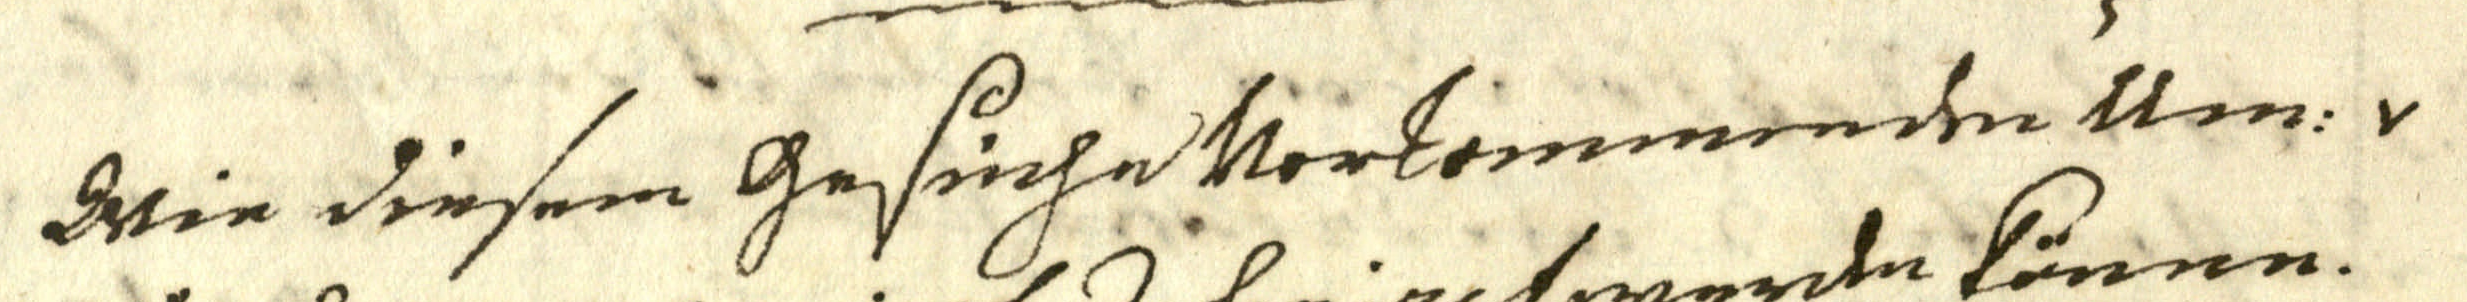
Wie diesem Gesuche vorkommenden Um¬
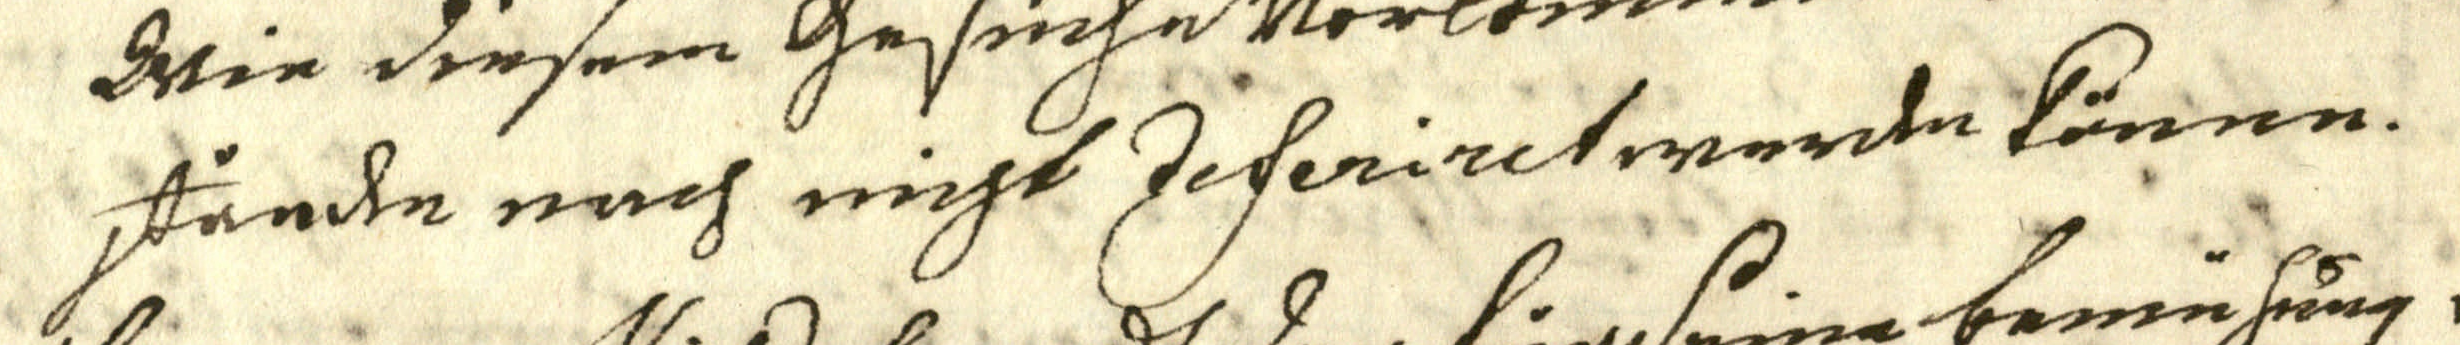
ständen nach nicht deferiret werden könne.
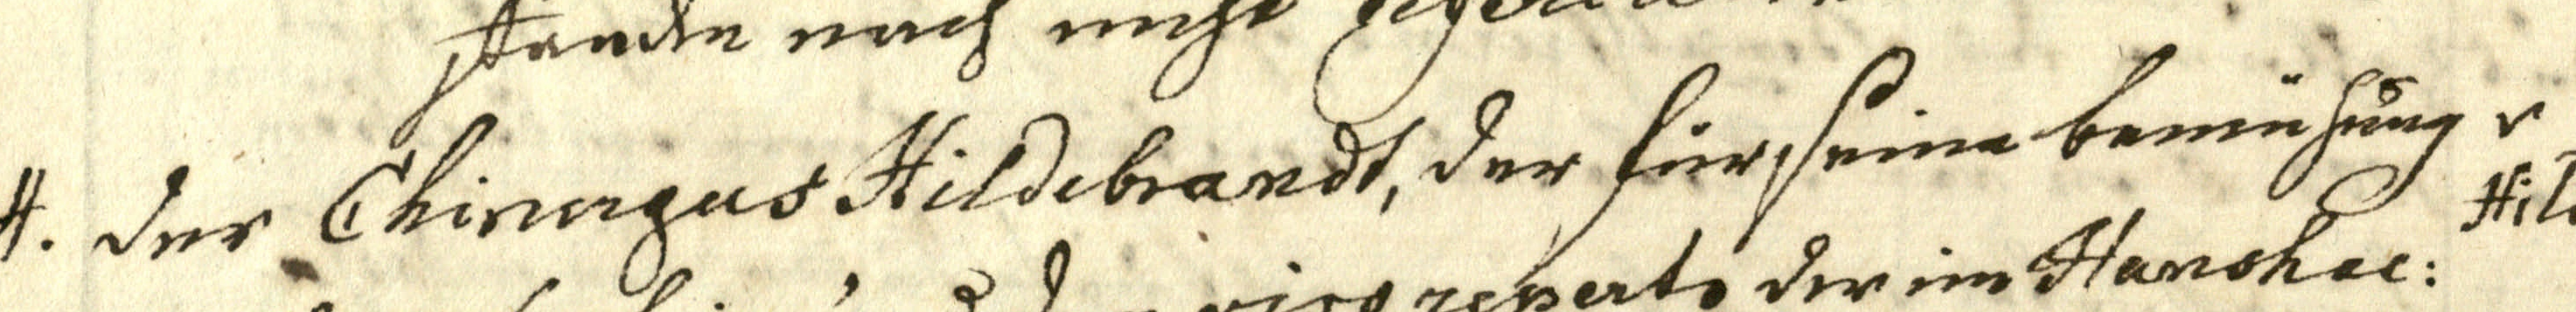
4. Der Chirurgus Hildebrandt, der für seine Bemühung
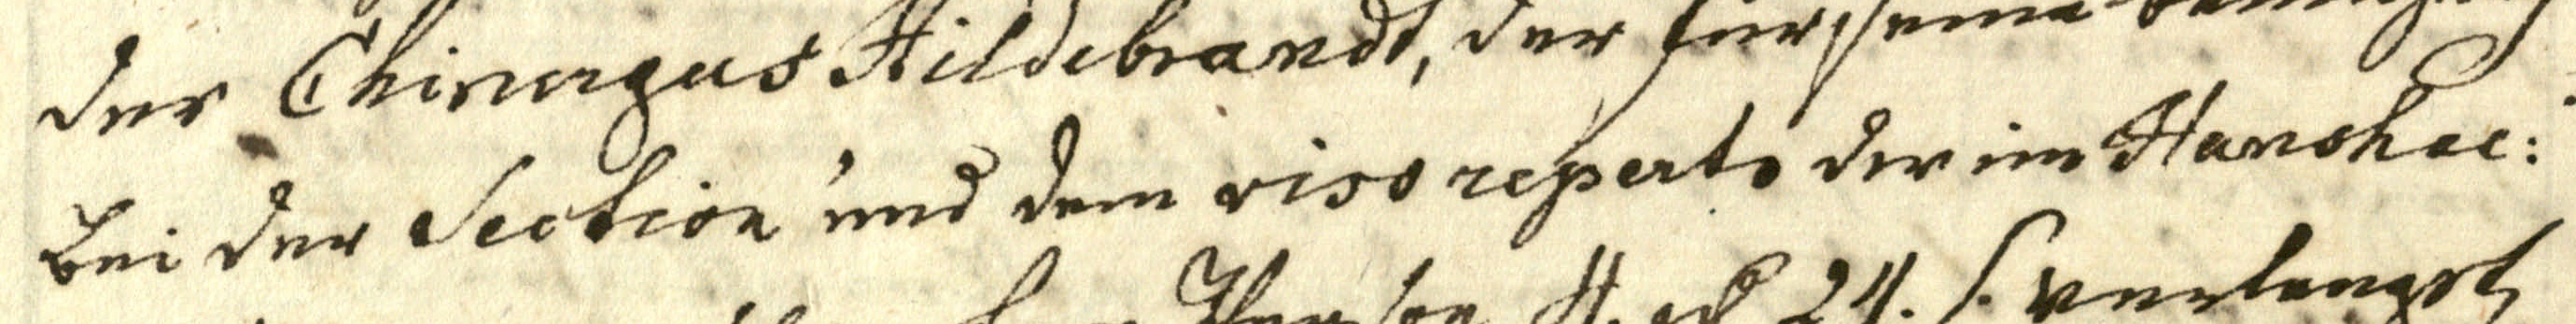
bei der Sections und dem viso reperto der in Hanshae¬
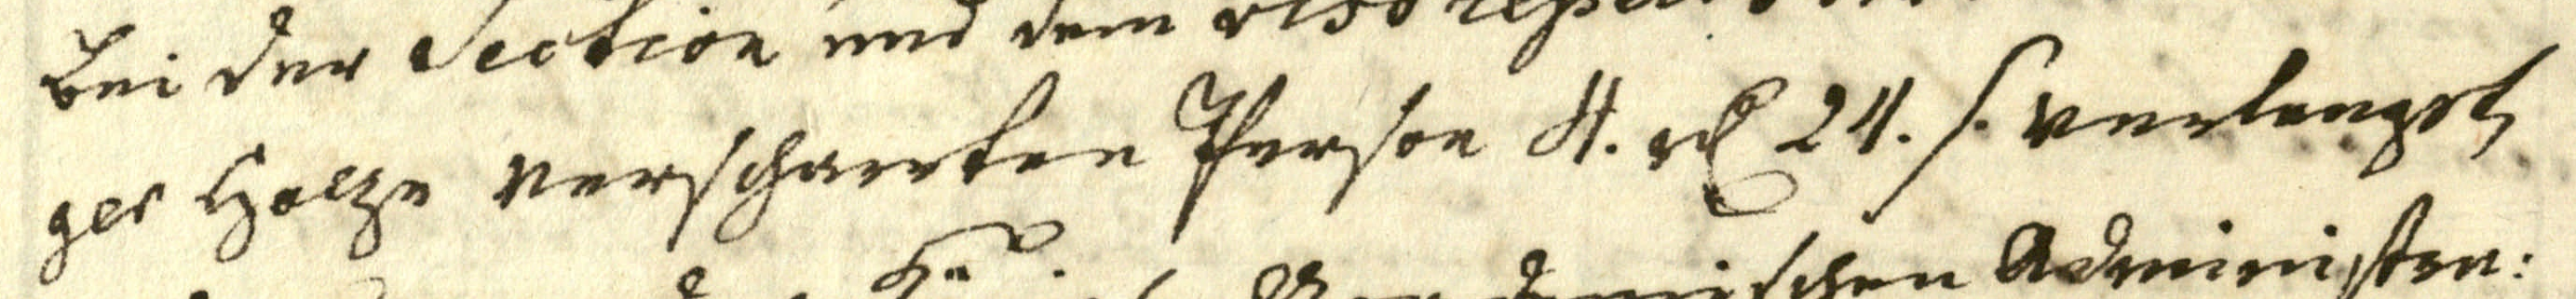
ger Holze verscharrten Person 4. rt. 24. s. verlanget
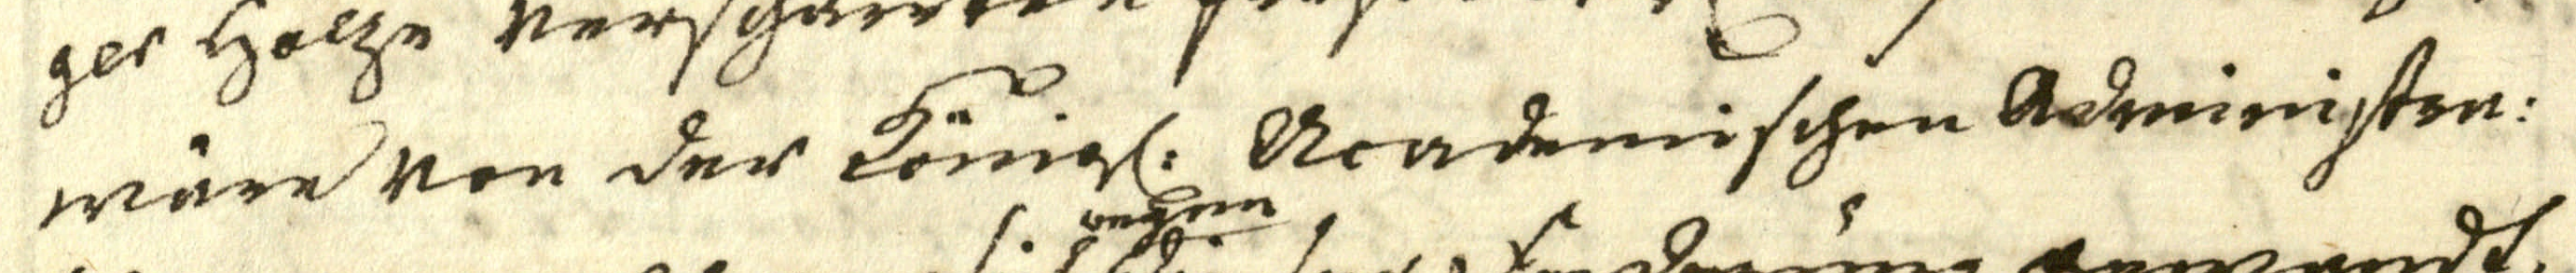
wäre von der Königl. Academischen Administra¬
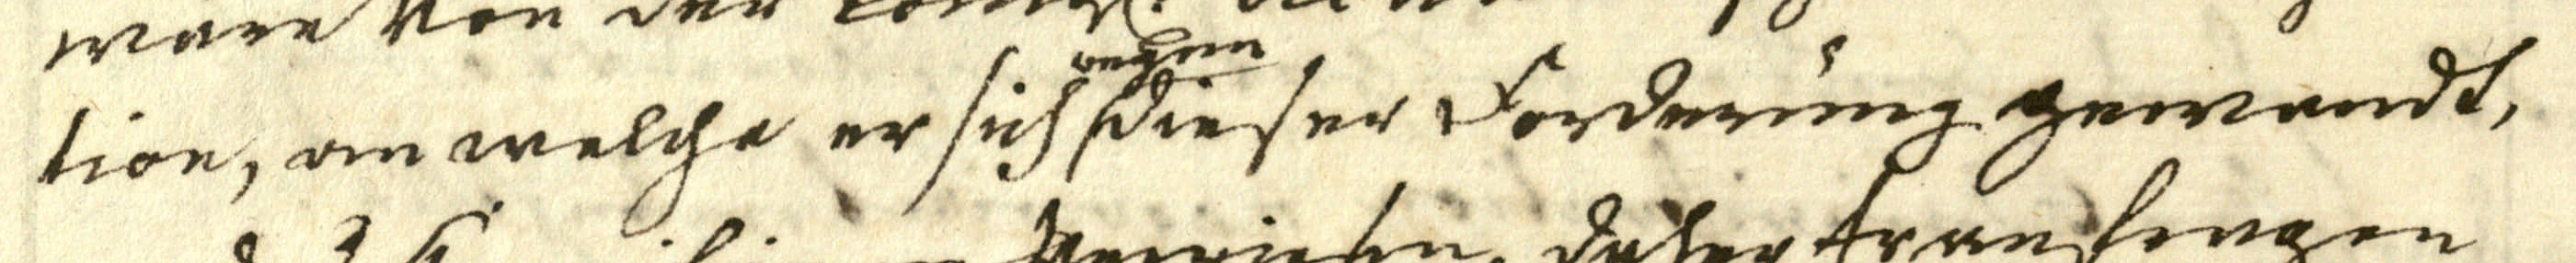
tion, an welche er sich wegen dieser Forderung gewandt,
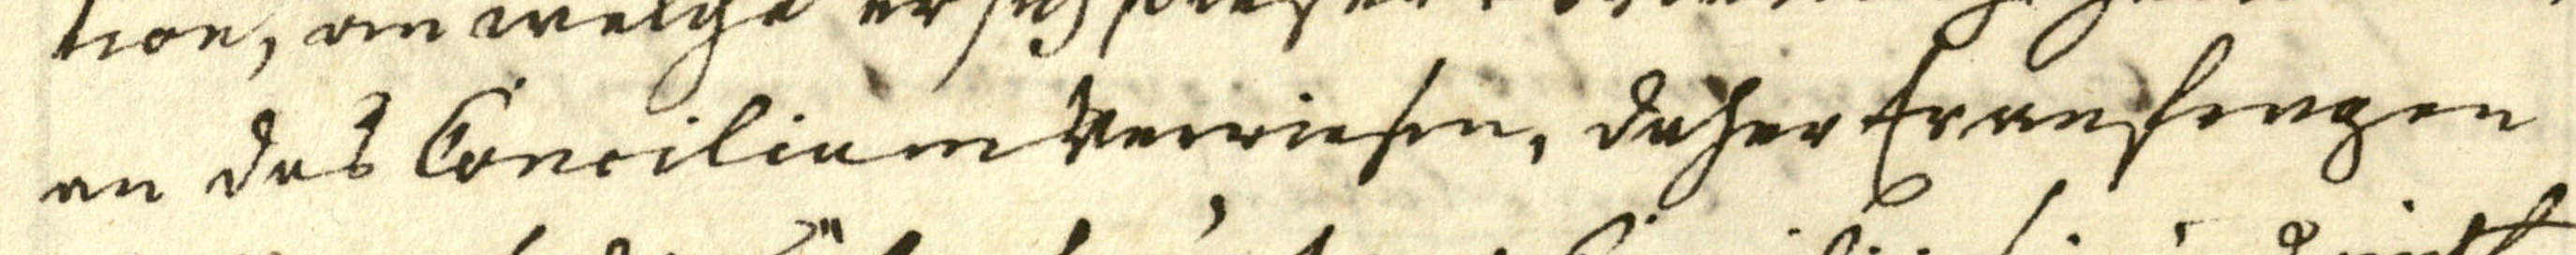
an das Concilium verwiesen, daher Er anfragen
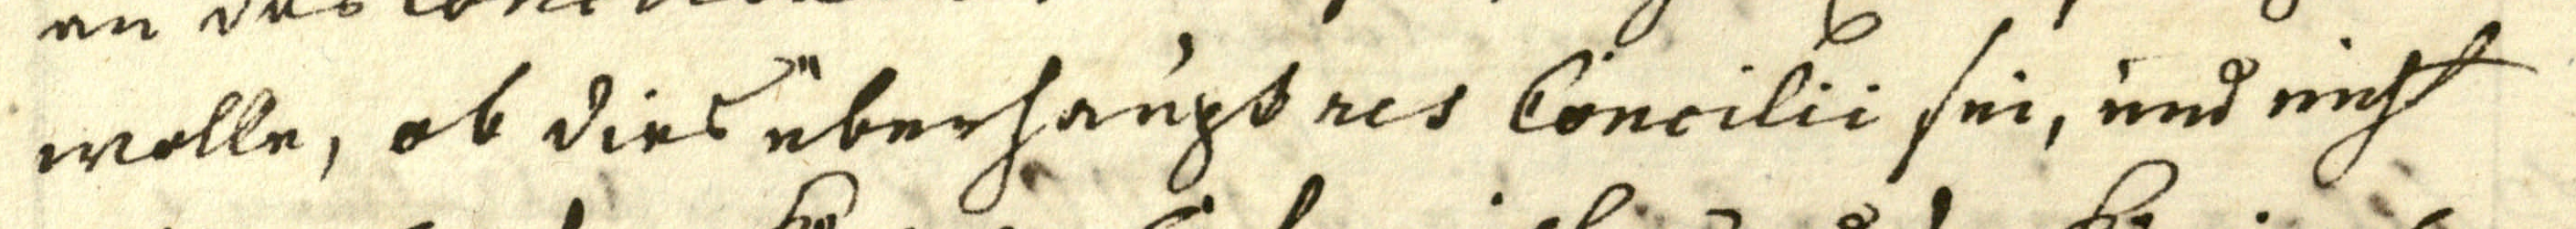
wolle, ob dies überhaupt res Concilii sei, und nicht
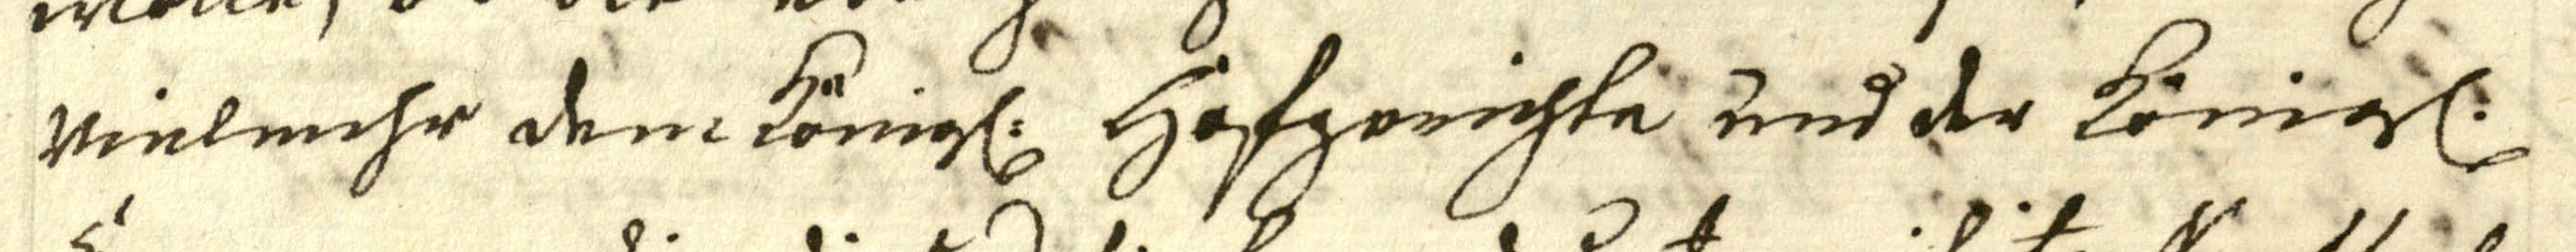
vielmehr dem Königl. Hofgerichte und der Königl.
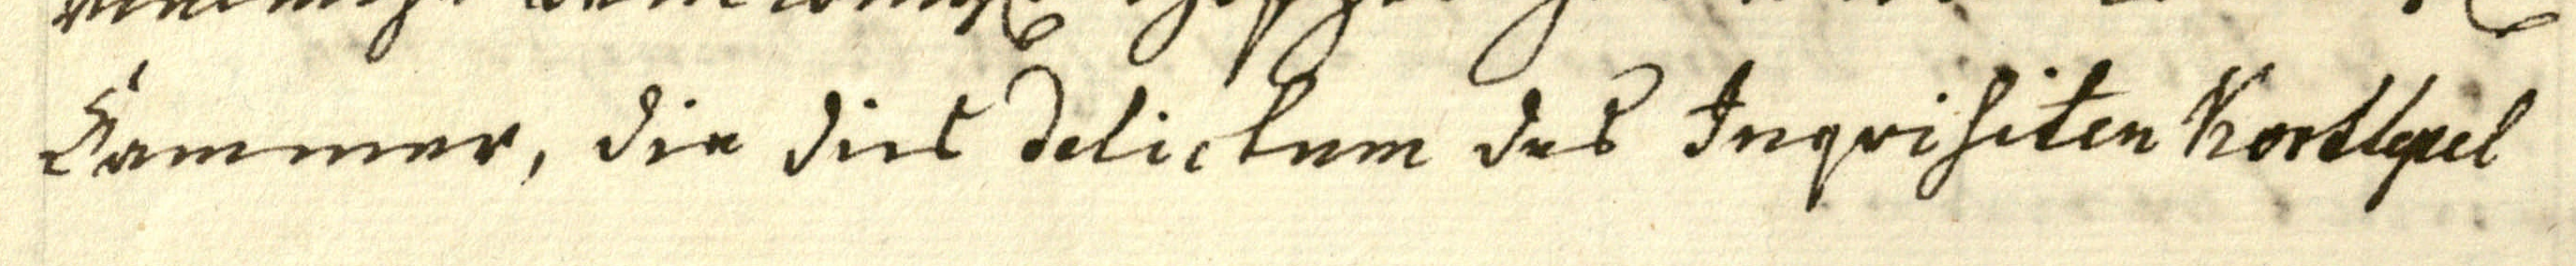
Kammer, die dies delictum das Inquisiten Kortlepel
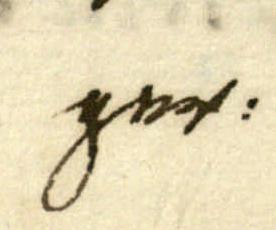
ger
